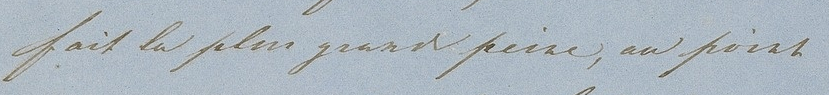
fait la plus grande peine, au point
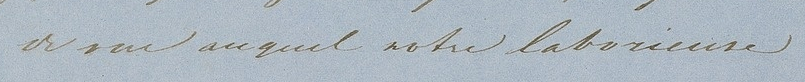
de vue auquel notre laborieuse
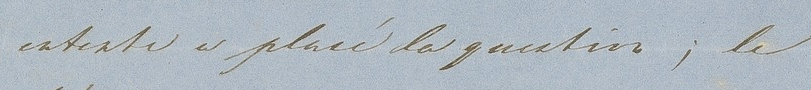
entente a placé la question; le
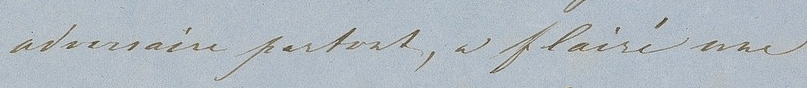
adversaire partout, a flairé une
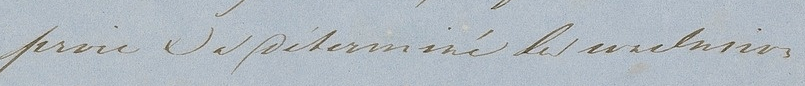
proie & a déterminé la conclusion
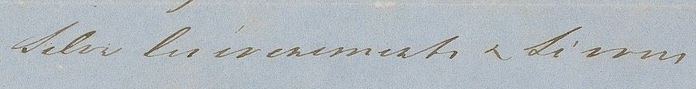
Selon les évenements & si vous
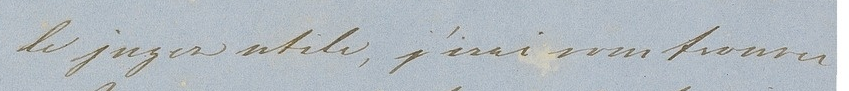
le jugez utile, j'irai vous trouver
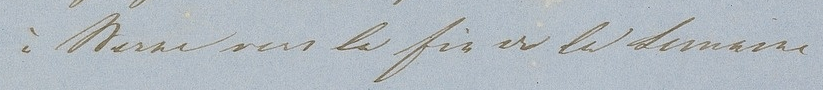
à Berne vers la fin de la Semaine
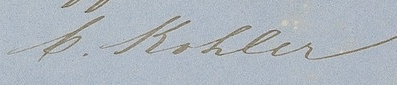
C. Kohler
